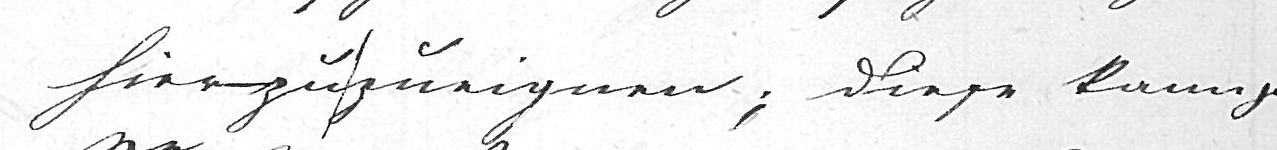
hierzuzueignen, diese kann
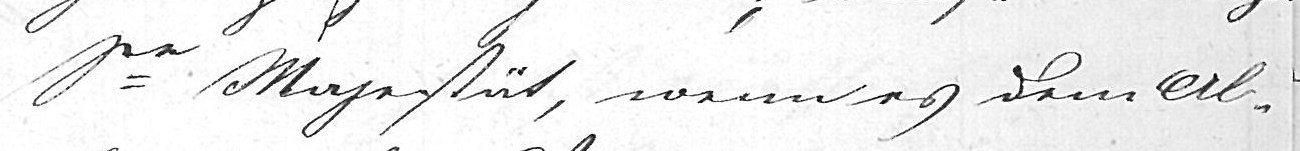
Sr Majestät, wenn es dem Al-
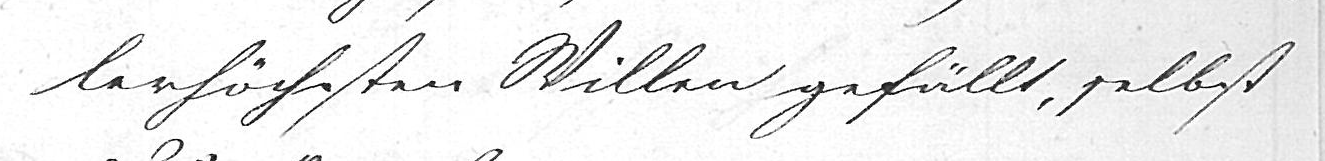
berhöchsten Willen gefällt, selbst
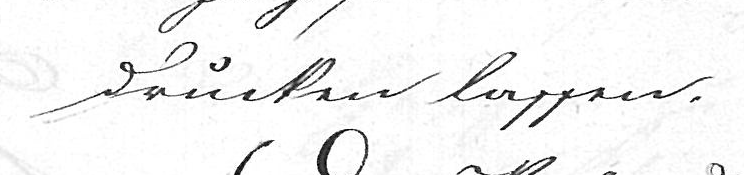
drucken lassen.
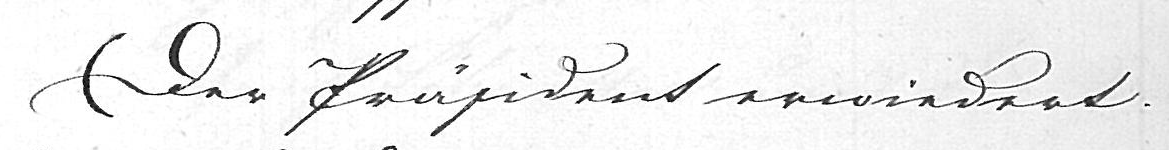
(Der Präsident erwidert
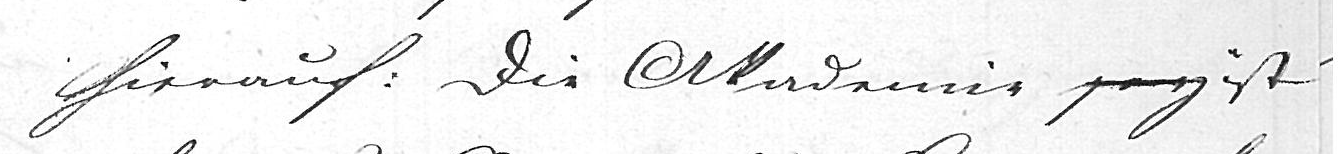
hierauf: Die Akademie sey ist
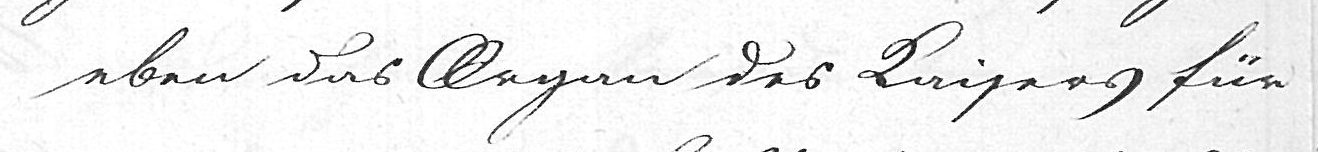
eben das Organ des Kaisers für
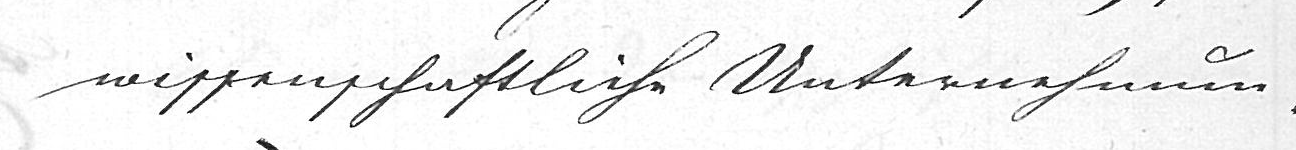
wissenschaftliche Unternehmun-
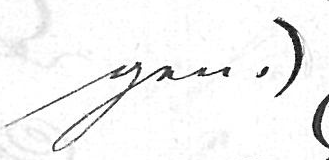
gen.)
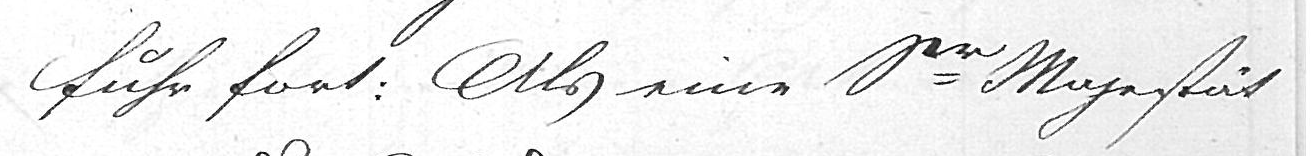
fuhr fort: Als eine Sr Majestät
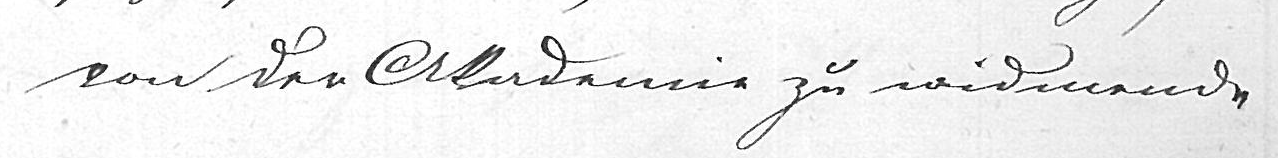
von der Akademie zu widmende
